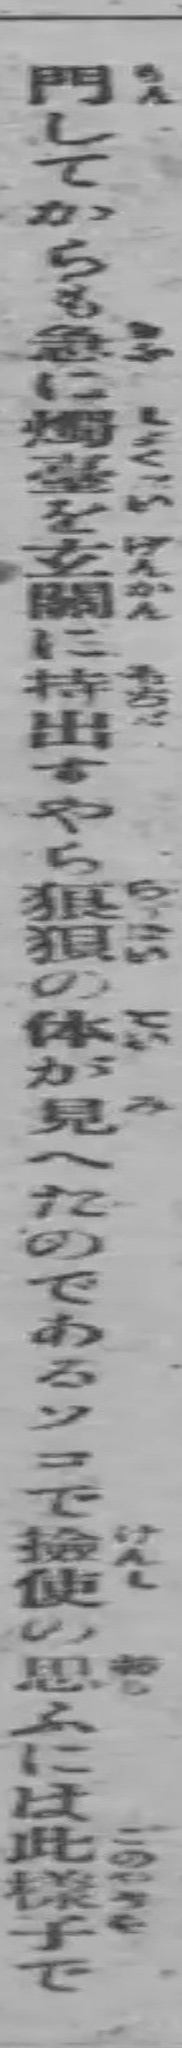門してからも急に燭台を玄関に持出すやら狼狽の体が見へたのであるソコで検使の思ふには此様子で
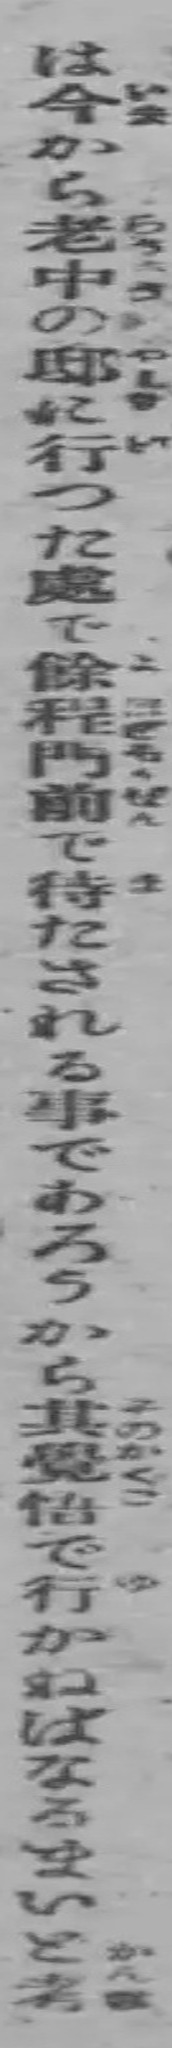は今から老中の邸に行つた処で余程門前で待たされる事であろうから其覚悟で行かねばなるまいと考
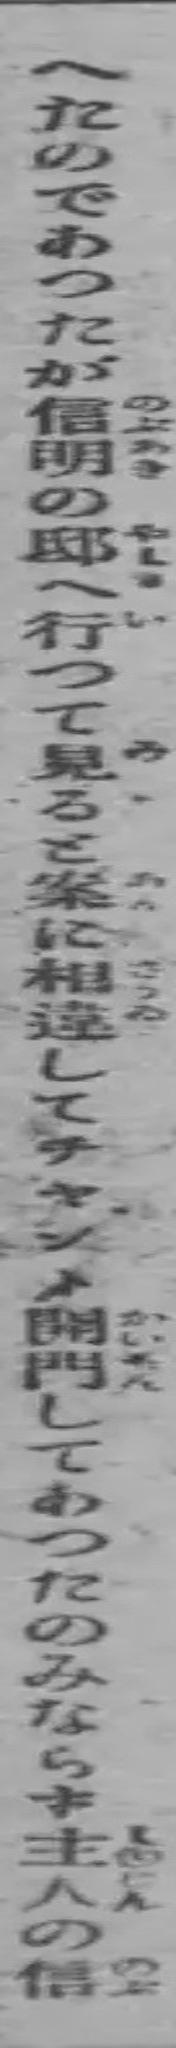へたのであつたが信明の邸へ行つて見ると案に相違してチヤント開門してあつたのみならず主人の信

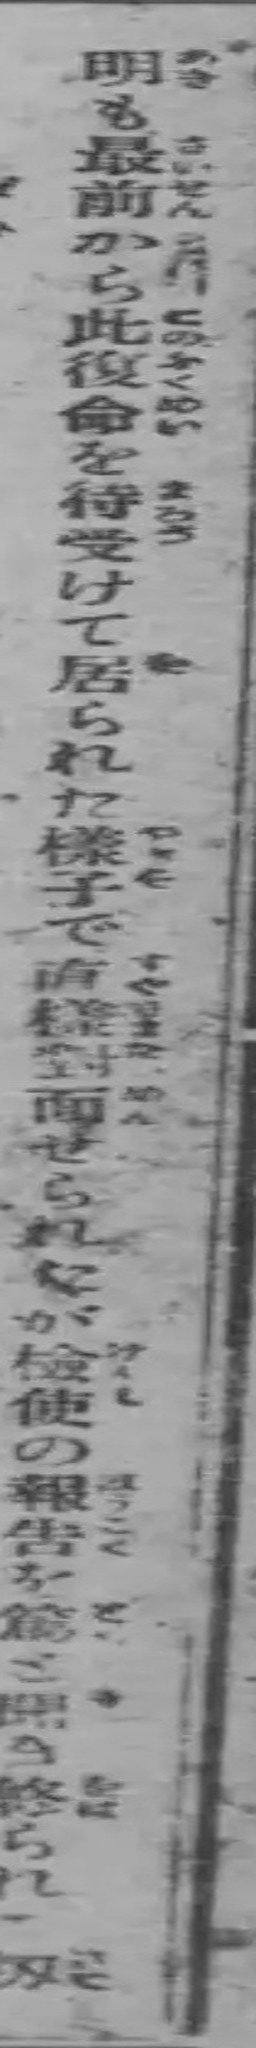明も最前から此復命を待受けて居られた様子で直様対面せられたが検使の報告を篤と聞き終られて扨
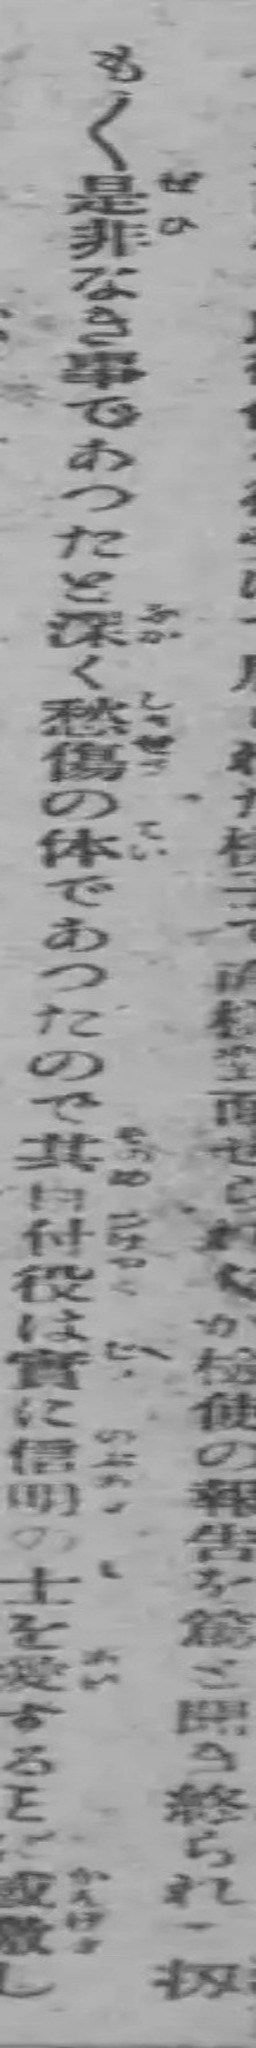も〳〵是非なき事であつたと深く愁傷の体であつたので其目付役は実に信明の士を愛することに感激し
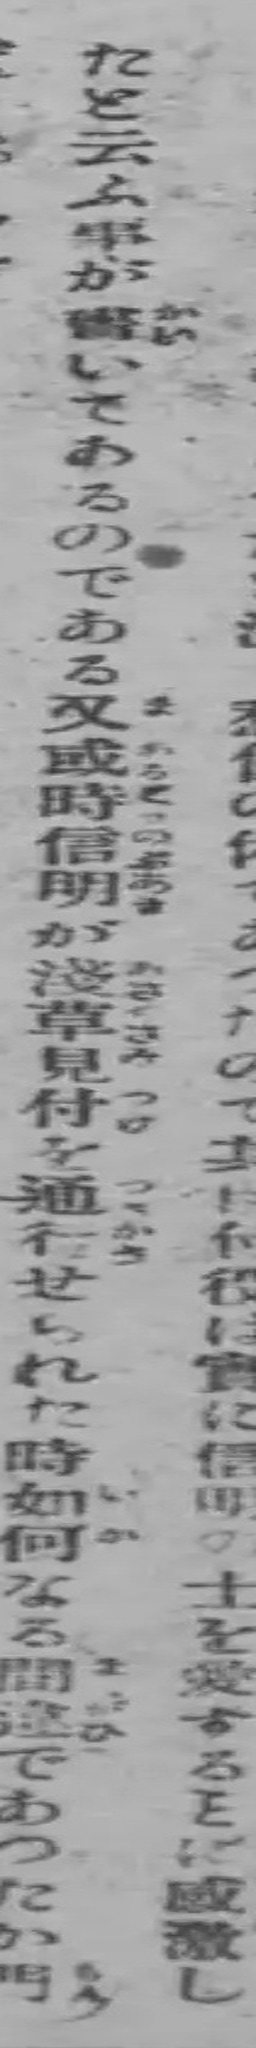たと云ふ事が書いてあるのである又或時信明が浅草見付を通行せられた時如何なる間違であつたか門
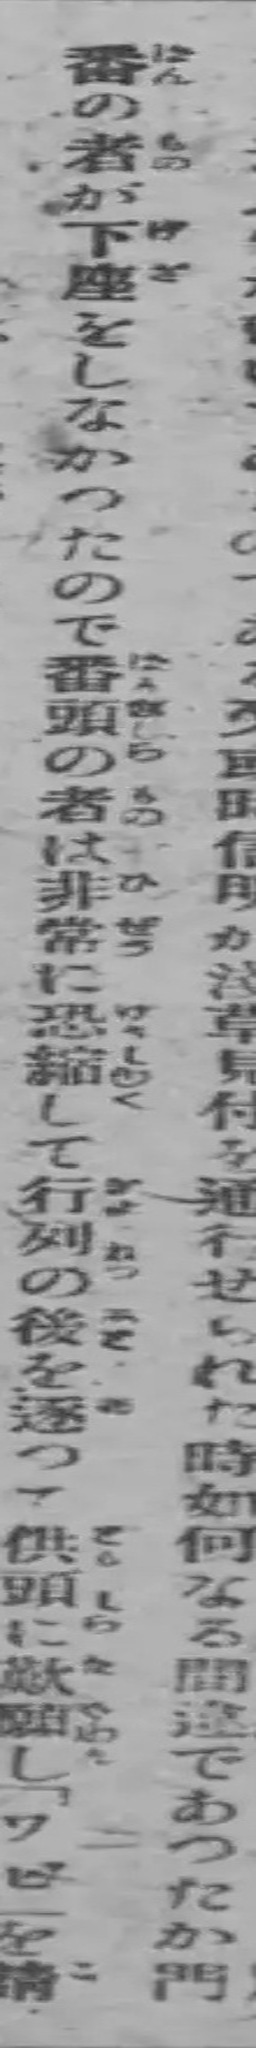番の者が下座をしなかつたので番頭の者は非常に恐縮して行列の後を遂つて供頭に歎願し「ワビ」を請
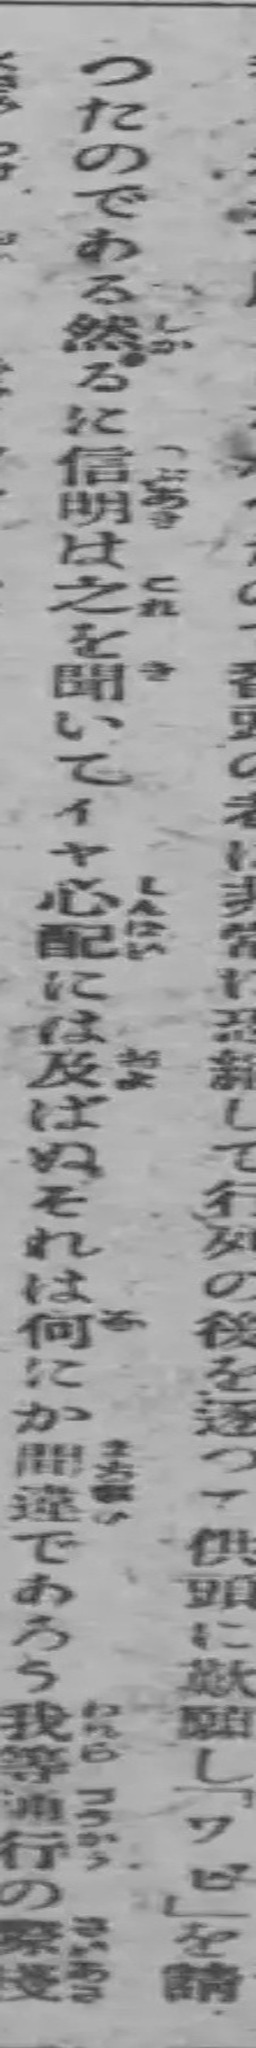つたのである然るに信明は之を聞いてイヤ心配には及ばぬそれは何にか間違であろう我等通行の際浅
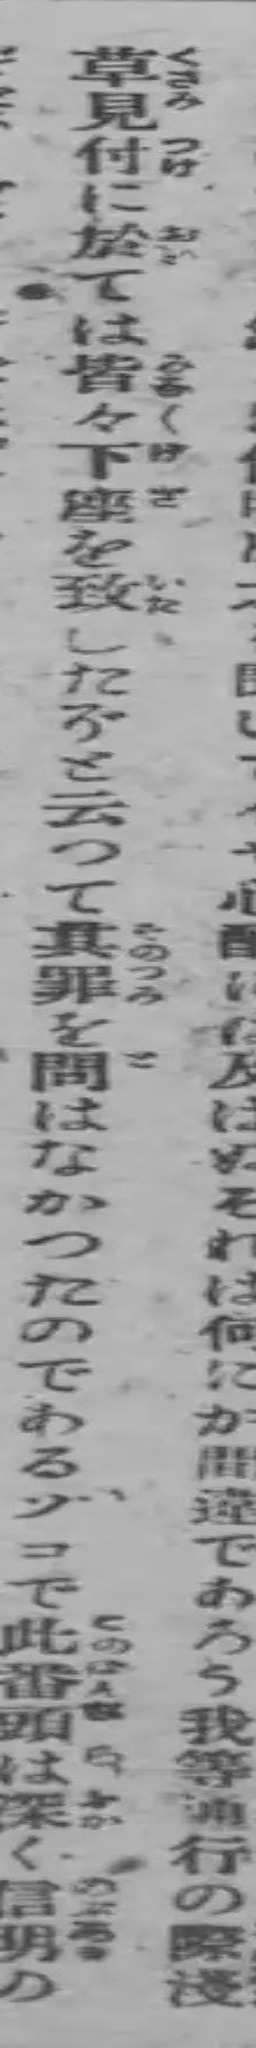草見付に於ては皆々下座を致したぞと云つて其罪を問はなかつたのであるソコで此番頭は深く信明の
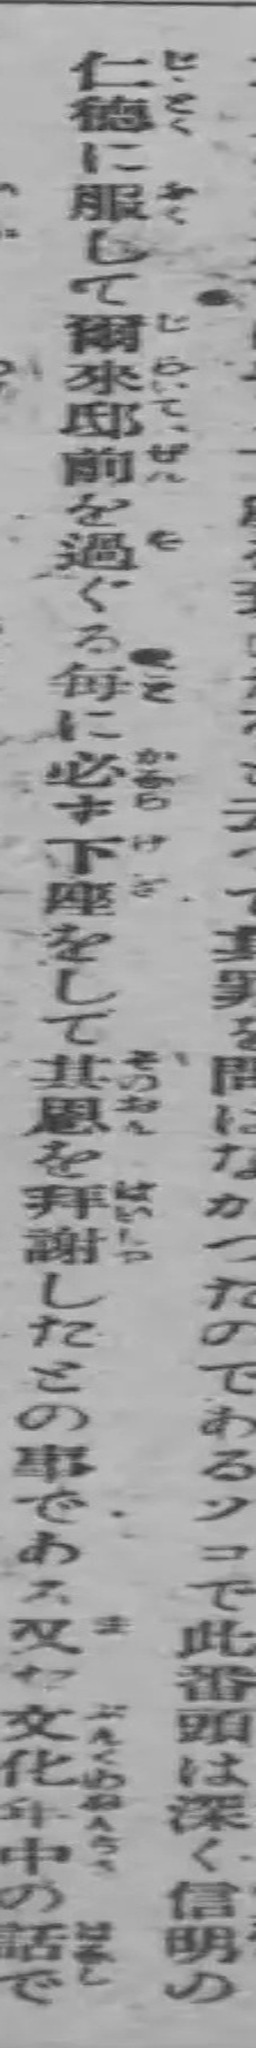仁徳に服して爾来邸前を過ぐる毎に必ず下座をして其恩を拝謝したとの事である又た文化年中の話で
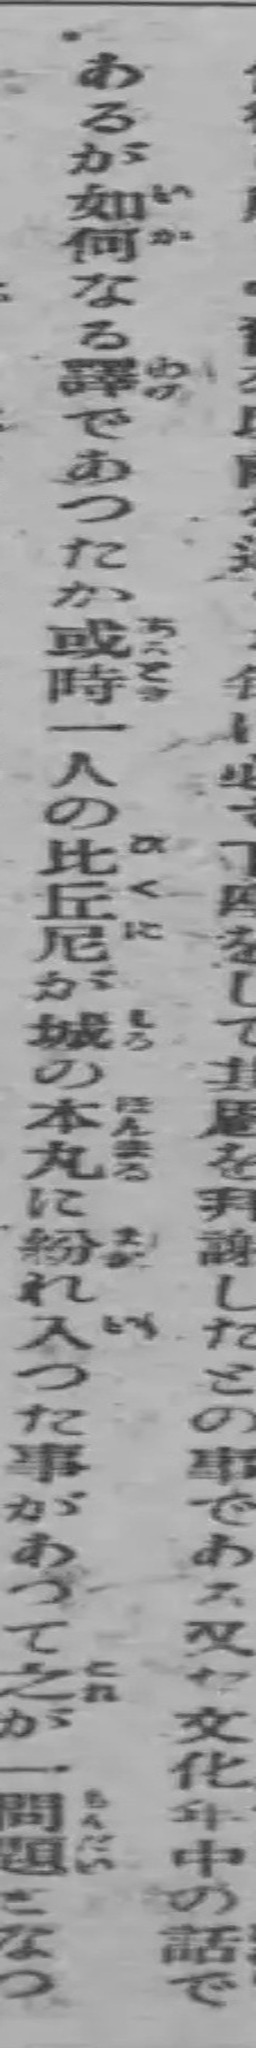あるが如何なる訳であつたか或時一人の比丘尼が城の本丸に紛れ入つた事があつて之が一問題となつ
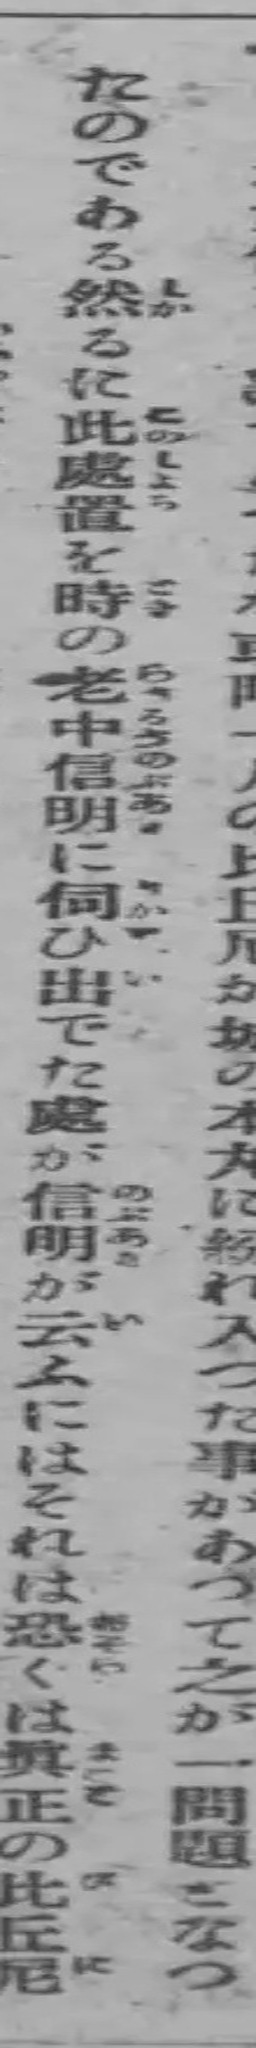たのである然るに此処置を時の老中信明に伺ひ出でた処が信明が云ふにはそれは恐くは真正の比丘尼
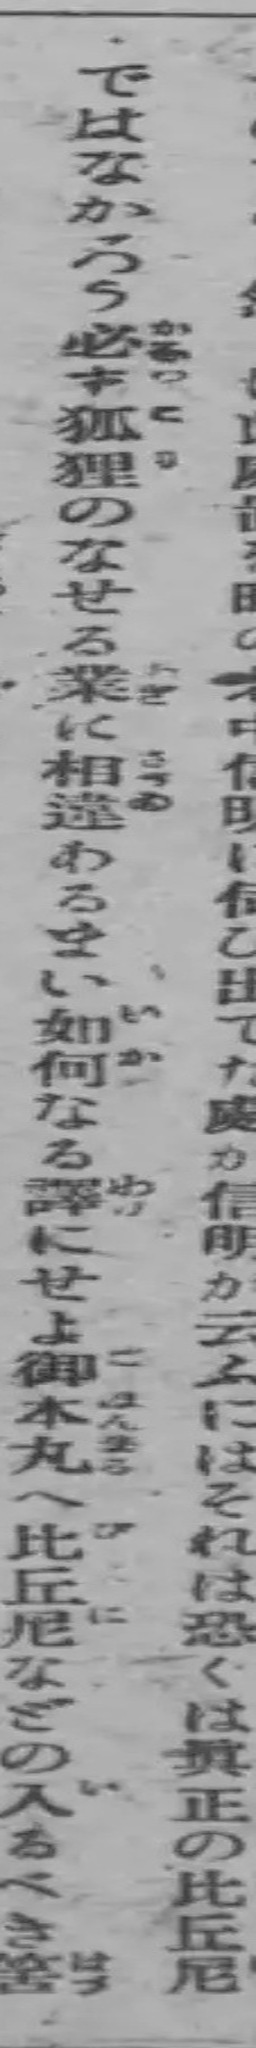ではなかろう必ず狐狸のなせる業に相違あるまい如何なる訳にせよ御本丸へ比丘尼などの入るべき筈
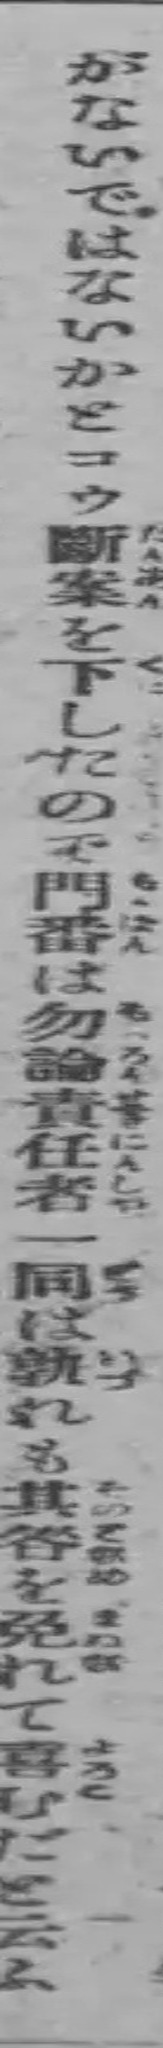がないではないかとコウ断案を下したので門番は勿論責任者一同は孰れも其咎を免れて喜むだと云ふ
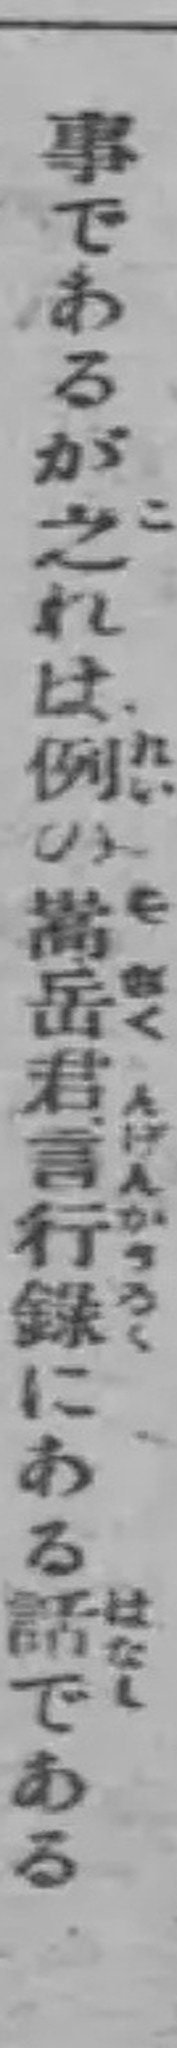事であるが之れは例の嵩岳君言行録にある話である
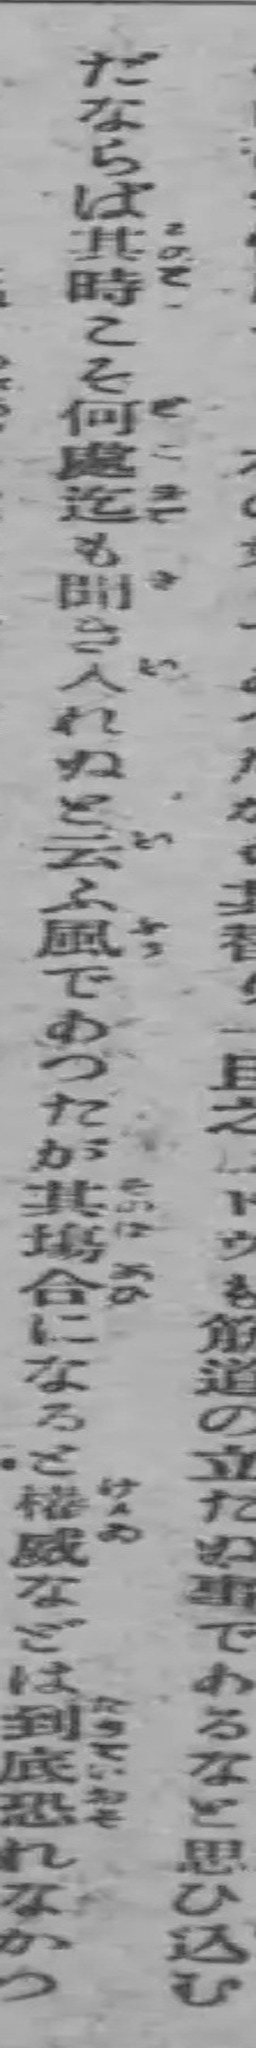だならば其時こそ何処迄も聞き入れぬと云ふ風であつたが其場合になると権威などは到底恐れなかつ
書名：豊橋市史談
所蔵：国立国会図書館 National Diet Library, JAPAN
